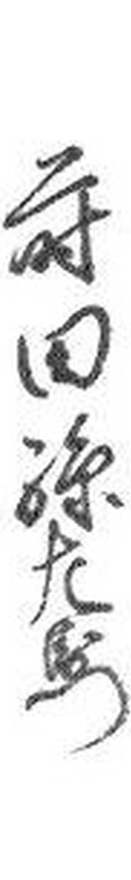蒔田孫左衛門
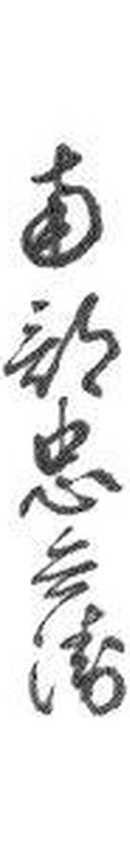南部忠兵衛
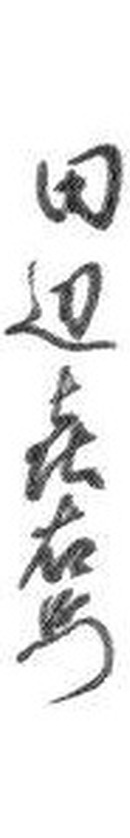田辺喜右衛門
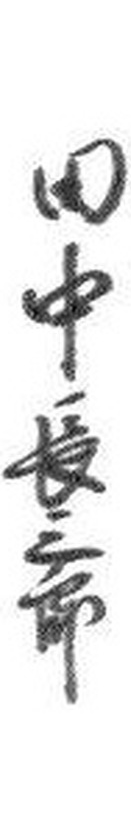田中長三郎
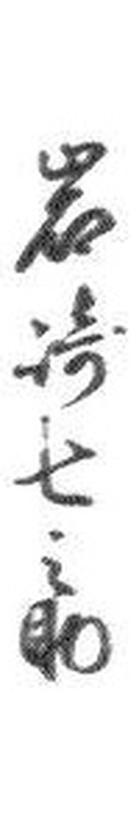岩崎七之助
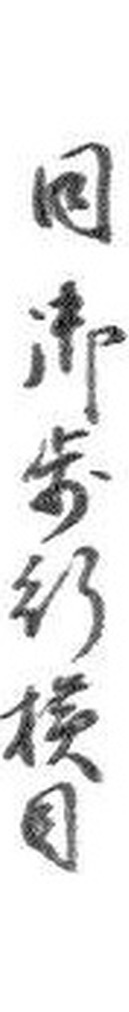同御歩行横目
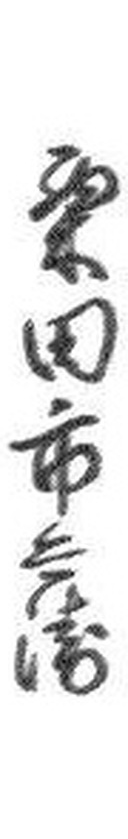栗田市兵衛
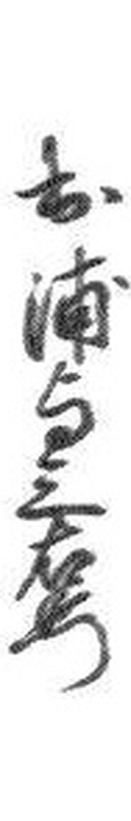出浦与三右衛門
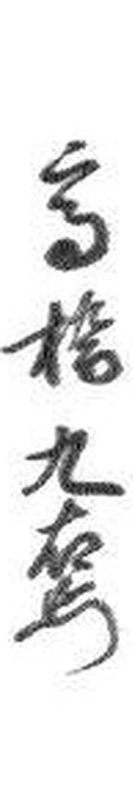高橋九右衛門
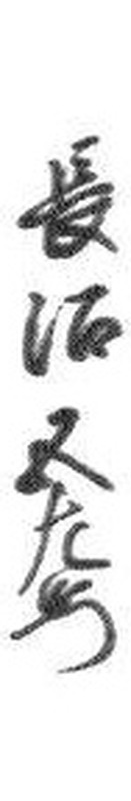長沼五左衛門

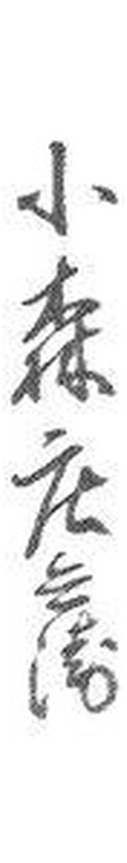小森庄兵衛
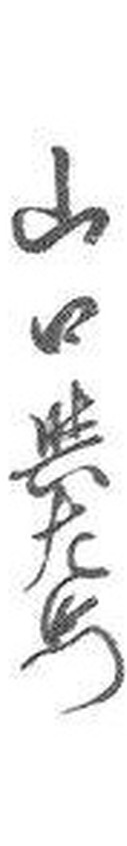山口与左衛門
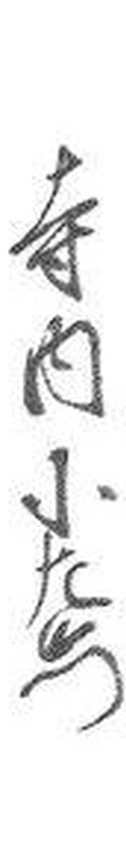寺内小左衛門
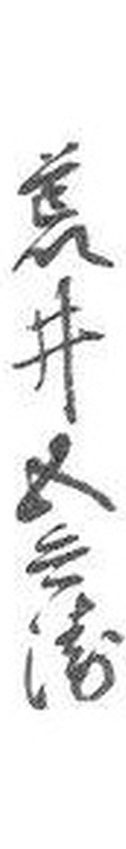荒井五兵衛
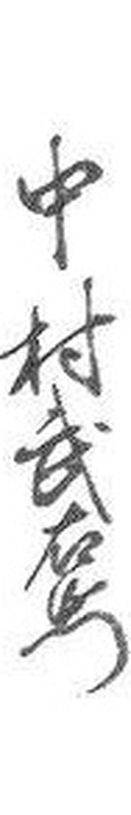中村武右衛門
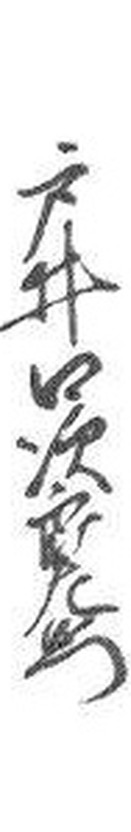戸井口次郎左衛門
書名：家譜 四 忠昌公 従寛永七年到正保四年
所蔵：福井県文書館 Fukui Prefectural Archives
